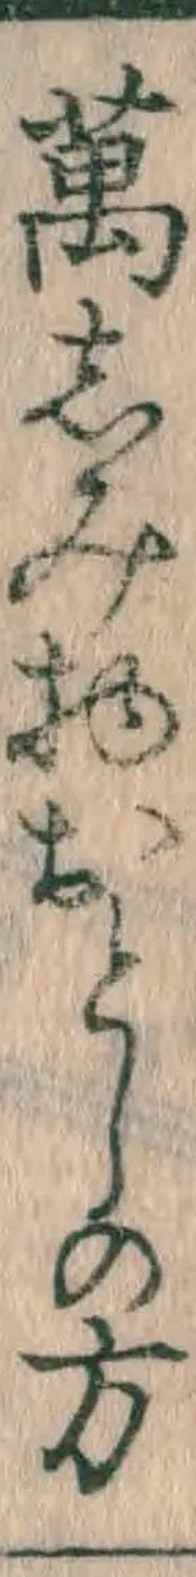萬しみ物おとしの方
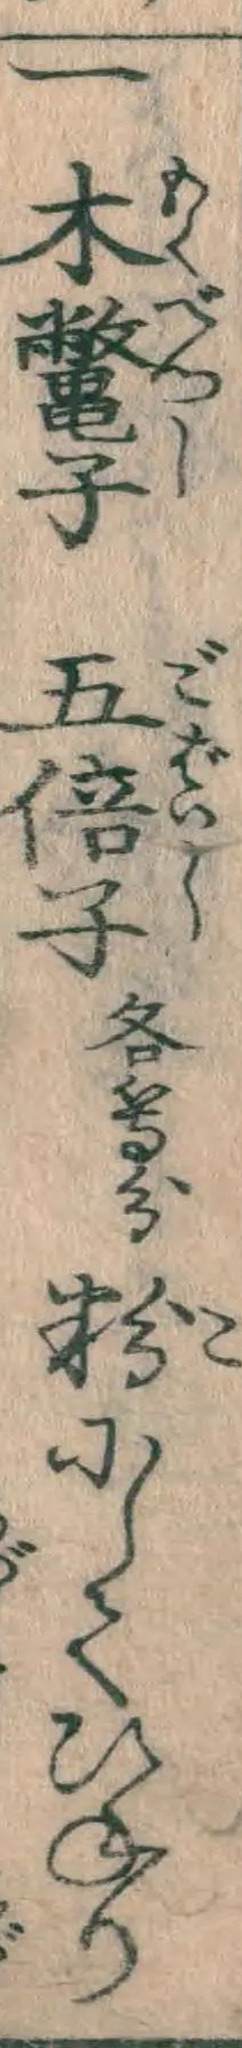一木龞子五倍子各等分粉にしてひねり
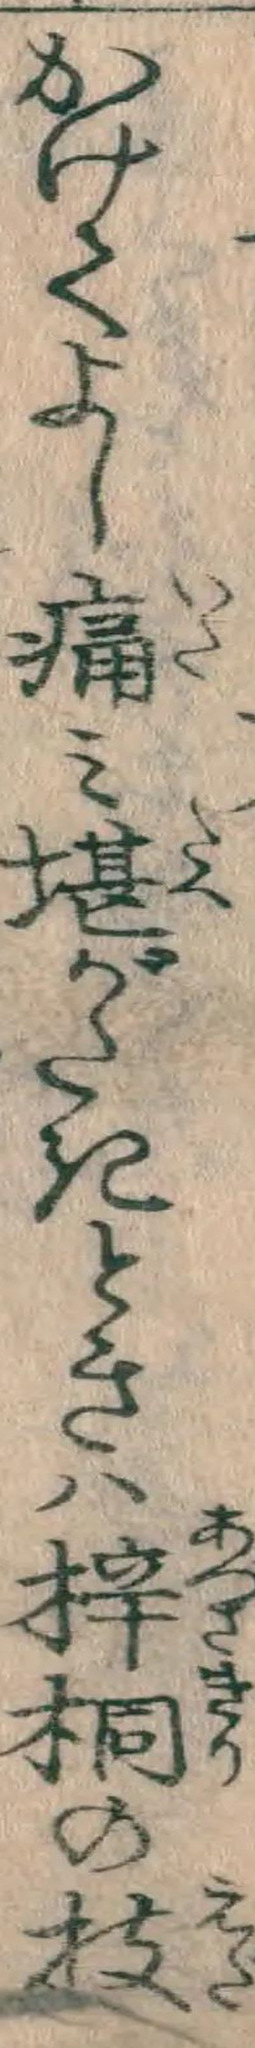かけてよし痛み堪がたきときは梓桐の枝
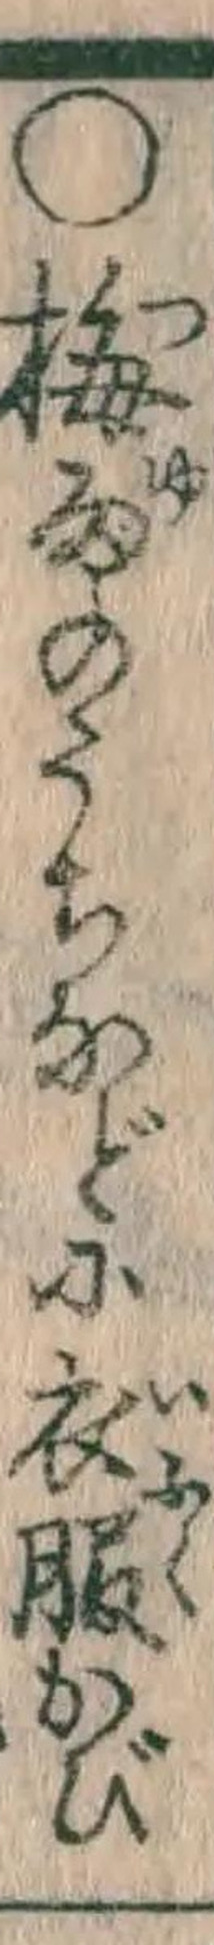○梅雨のうちなどに衣服かび
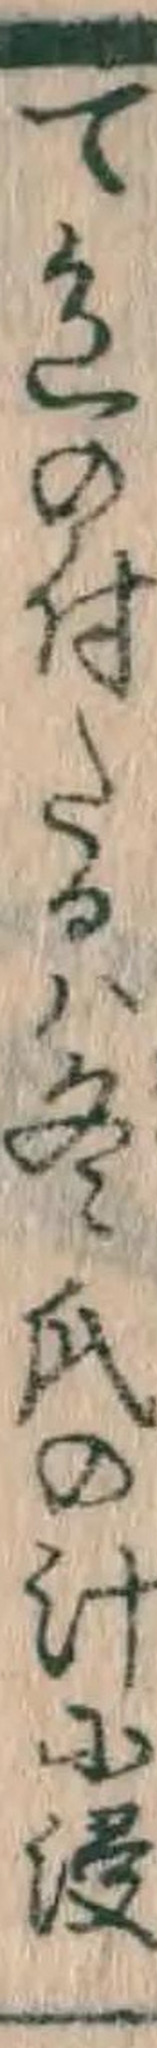て色の付たるは冬瓜の汁に浸
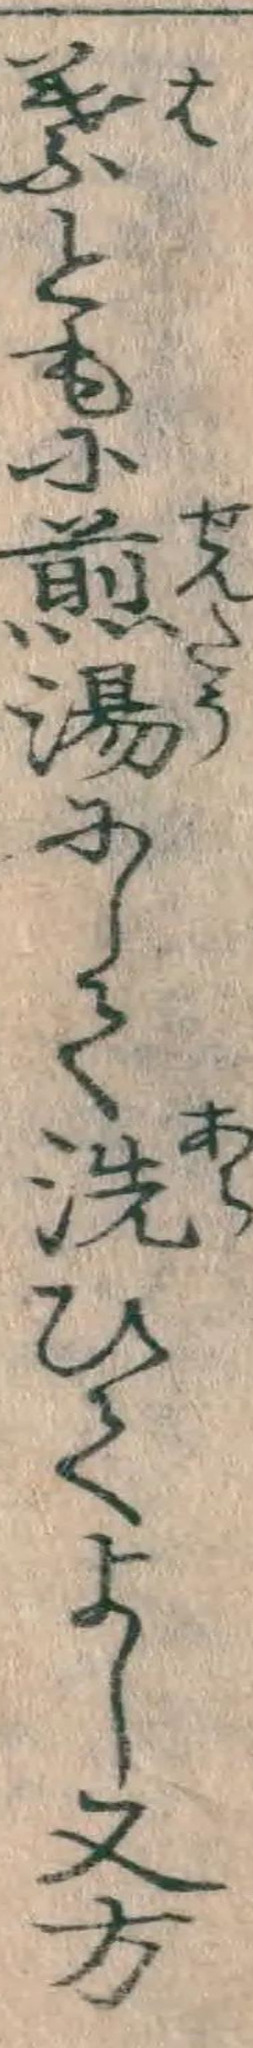葉ともに煎湯にして洗ひてよし又方
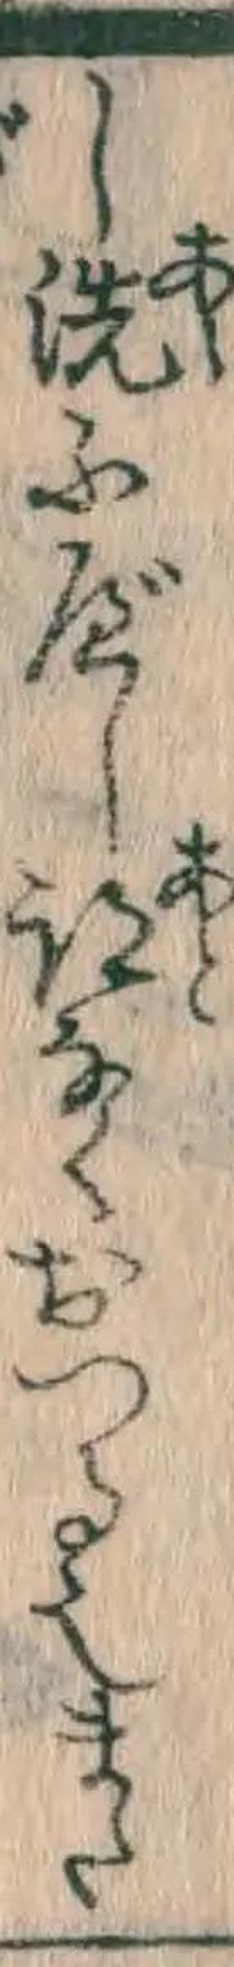し洗ふべし跡なくおつる也また
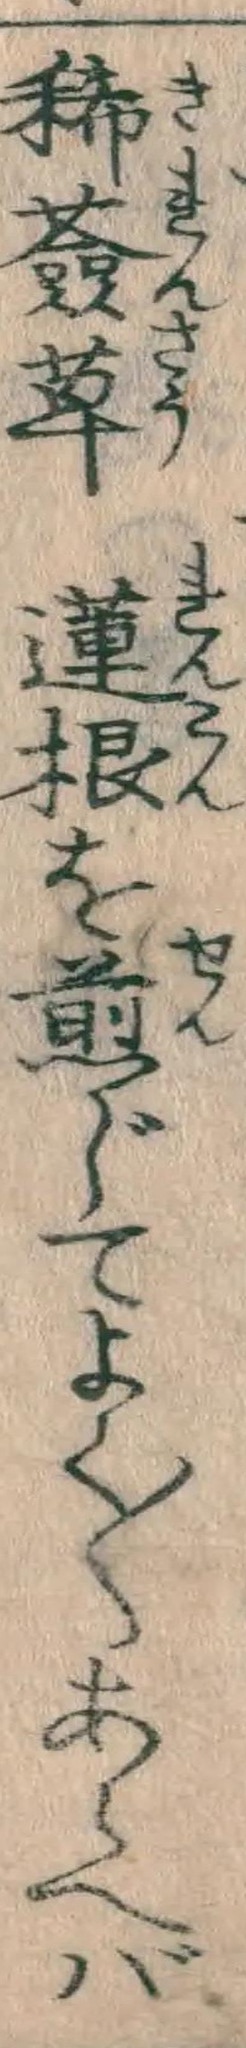稀薟草蓮根を煎じてよく〳〵あらへば
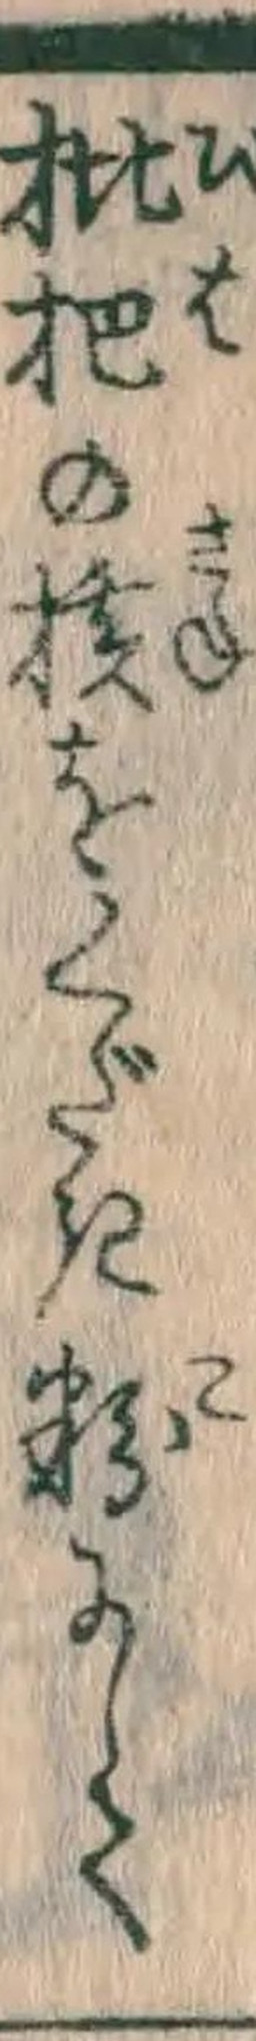枇杷の核をくだき粉にして
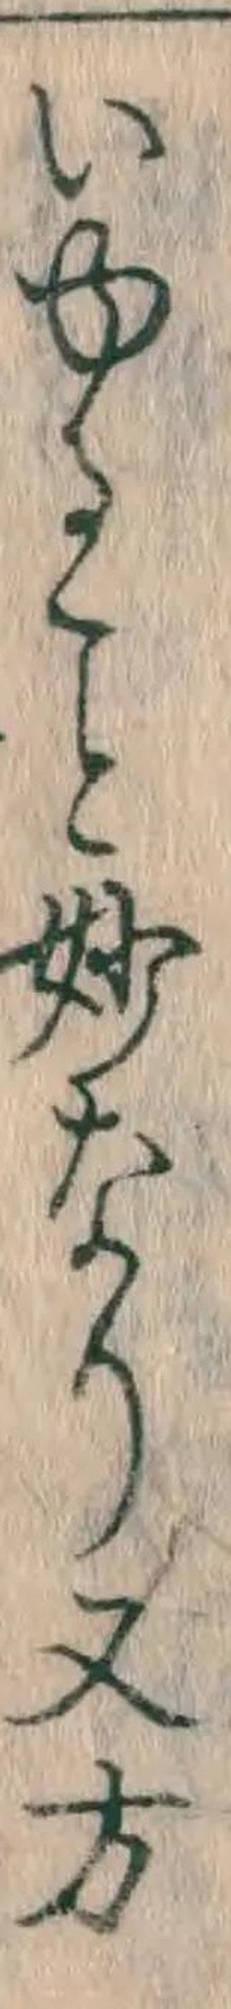いゆること妙なり又方
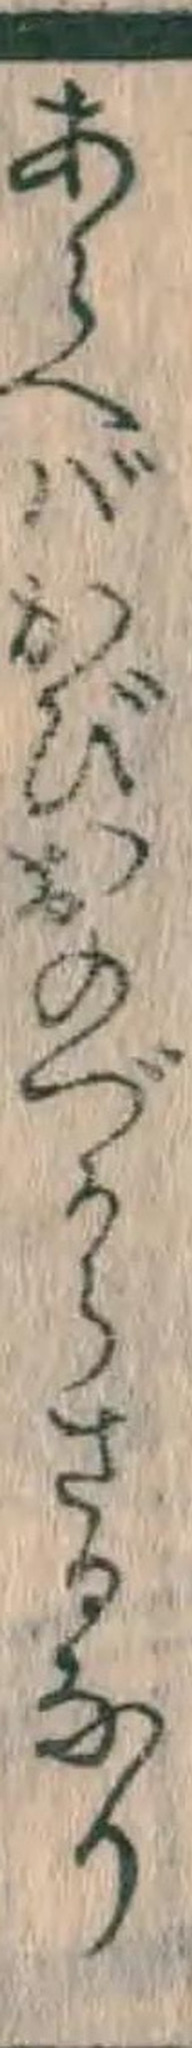あらへばかびおのづからさるなり
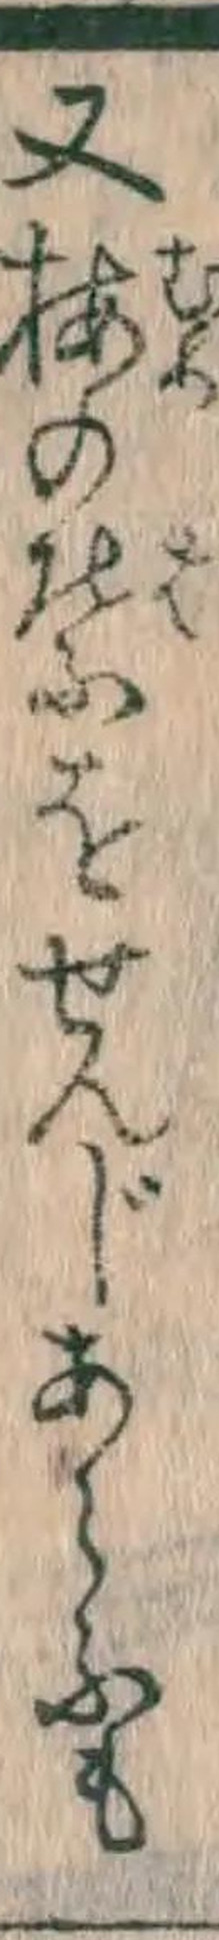又梅の葉をせんじあらふも
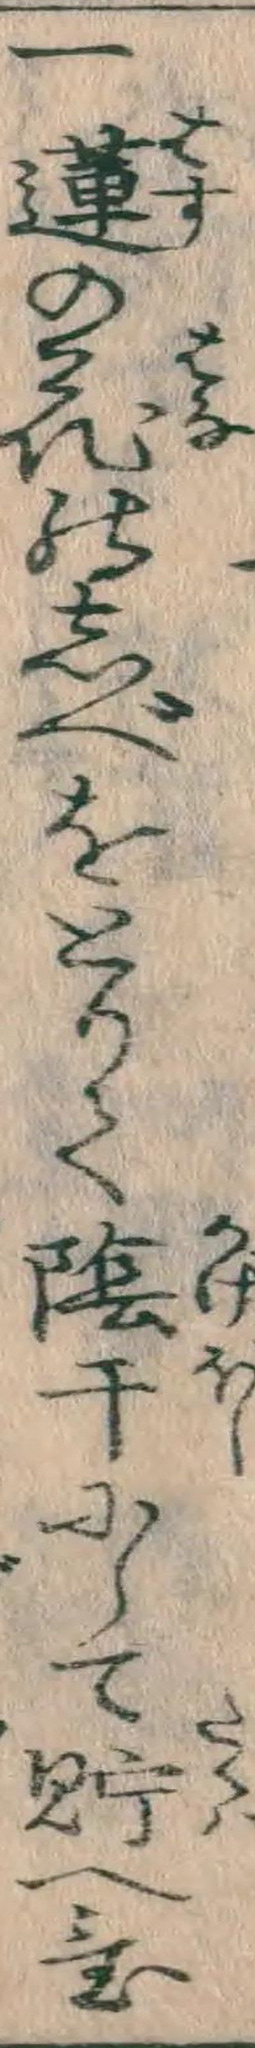一蓮の花のしべをとりて陰干にして貯へ置
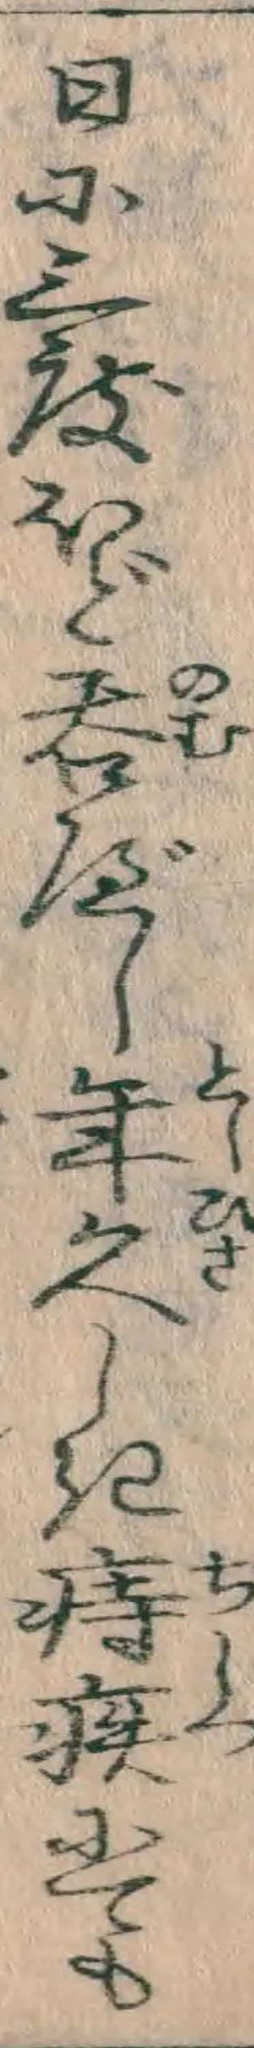日に三度ほど呑べし年久しき痔疾にても
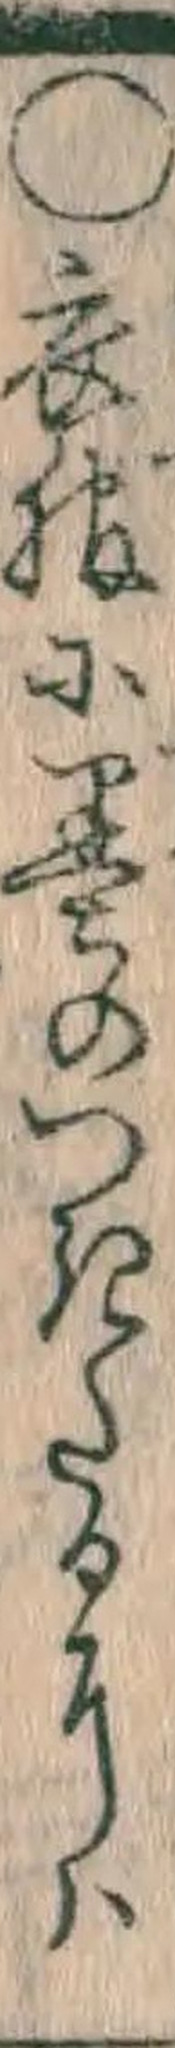○衣服に墨のつきたるには
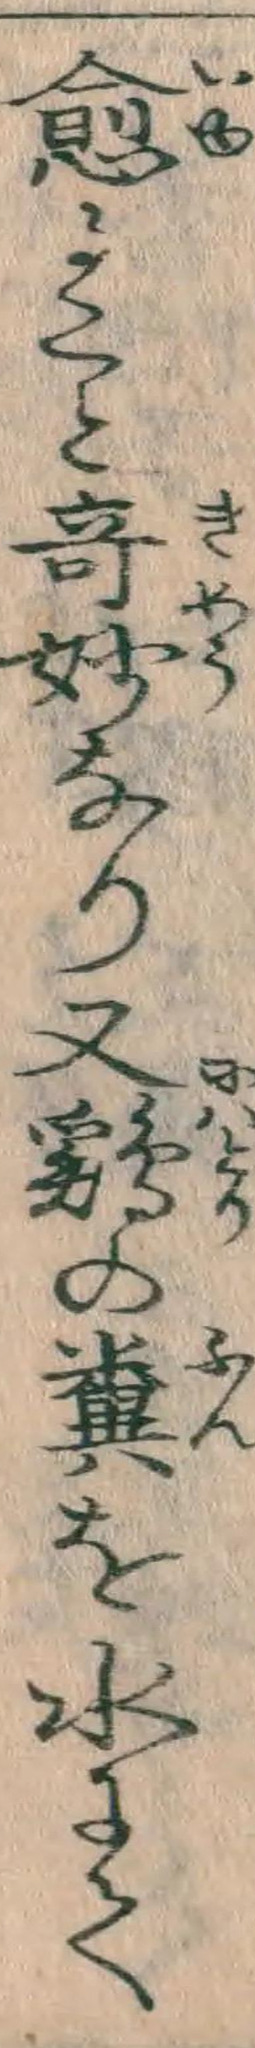愈ること奇妙なり又鶏の糞を水にて
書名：広益秘事大全 3巻. [3]
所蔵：国立国会図書館 National Diet Library, JAPAN
